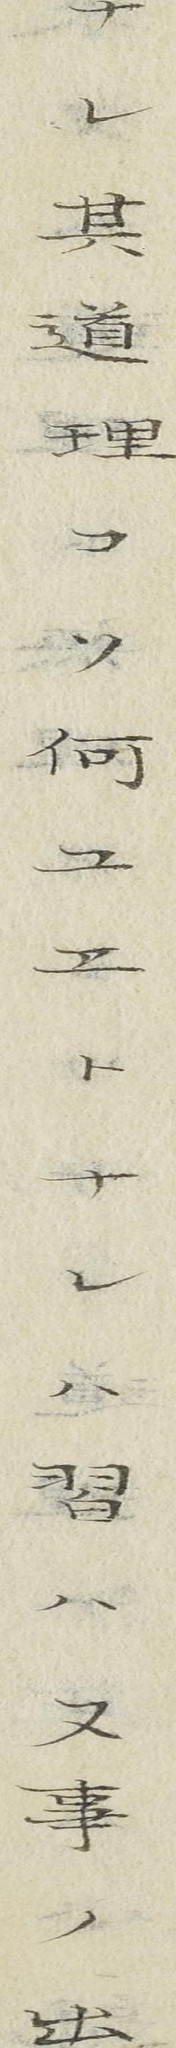ナレ其道理コソ何ユエトナレハ習ハヌ事ノ出

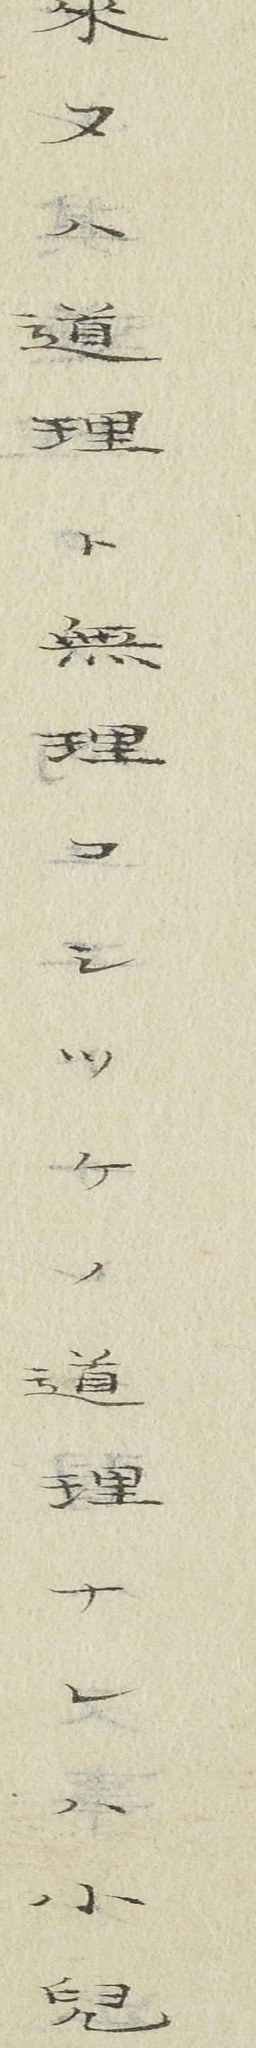来ヌハ道理ト無理コシツケノ道理ナレハ小児
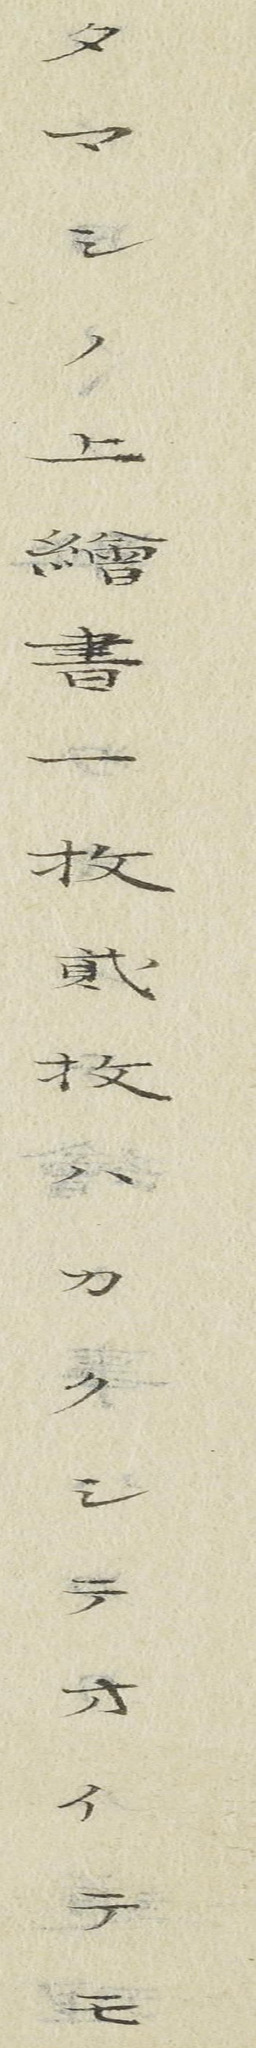タマシノ上絵書一枚弐枚ハカクシテオイテモ
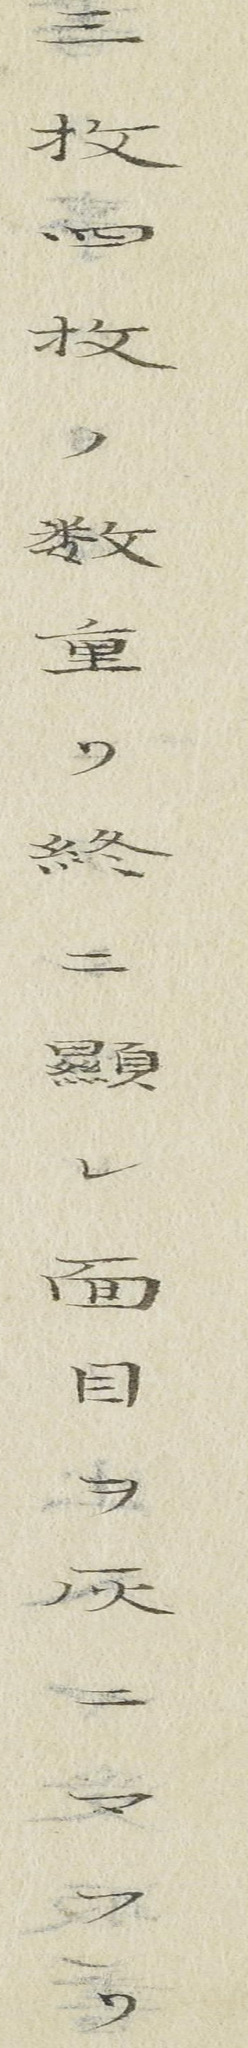三枚四枚ノ数重リ終ニ顕レ面目ヲ灰ニマフリ
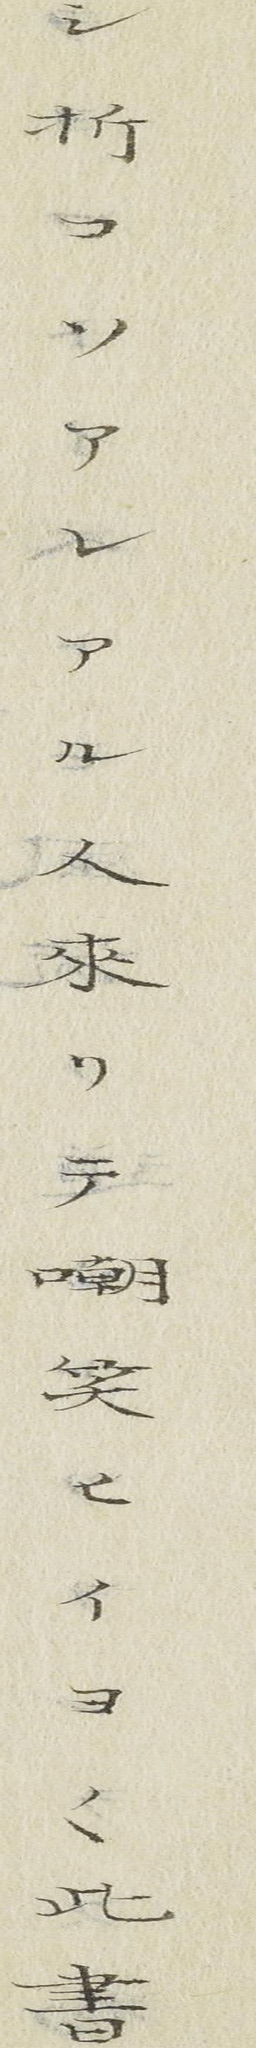シ折コソアレアル人来リテ嘲笑ヒイヨ〱此書
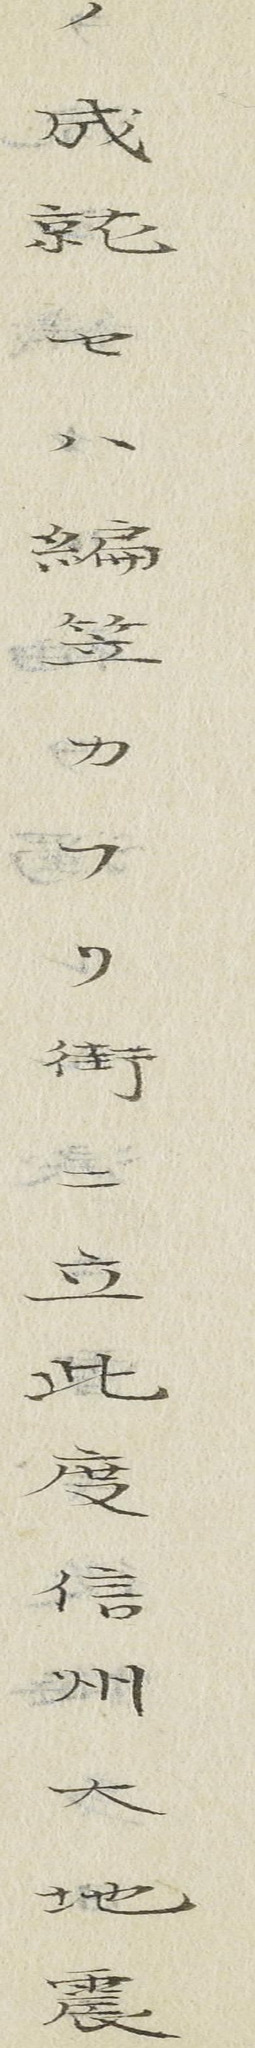ノ成就セハ編笠カフリ街ニ立此度信州大地震
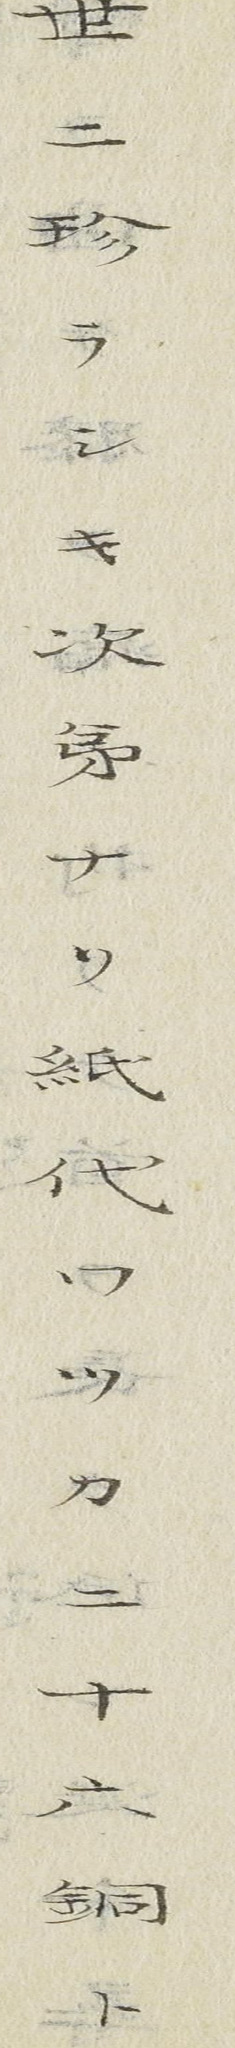世ニ珍ラシキ次第ナリ紙代ワツカニ十六銅ト
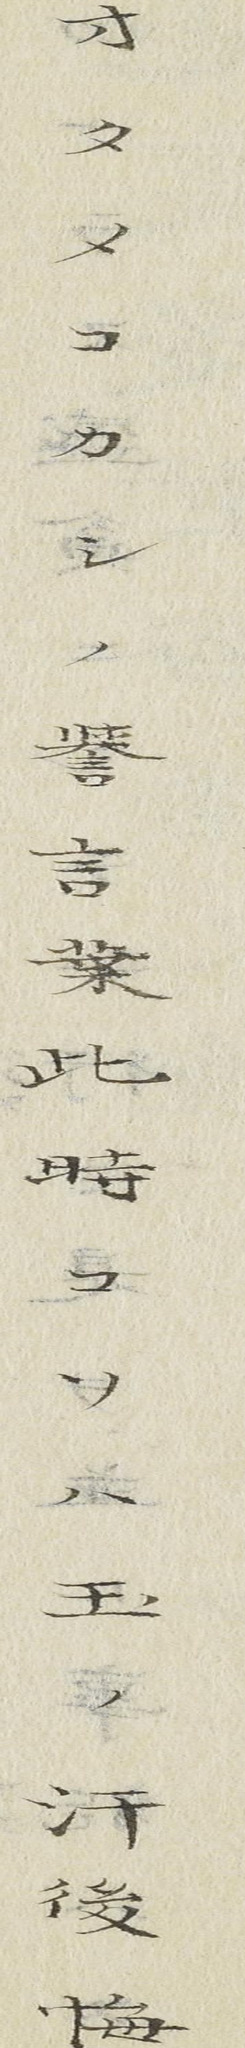オタメコカシノ誉言葉此時コソハ玉ノ汗後悔
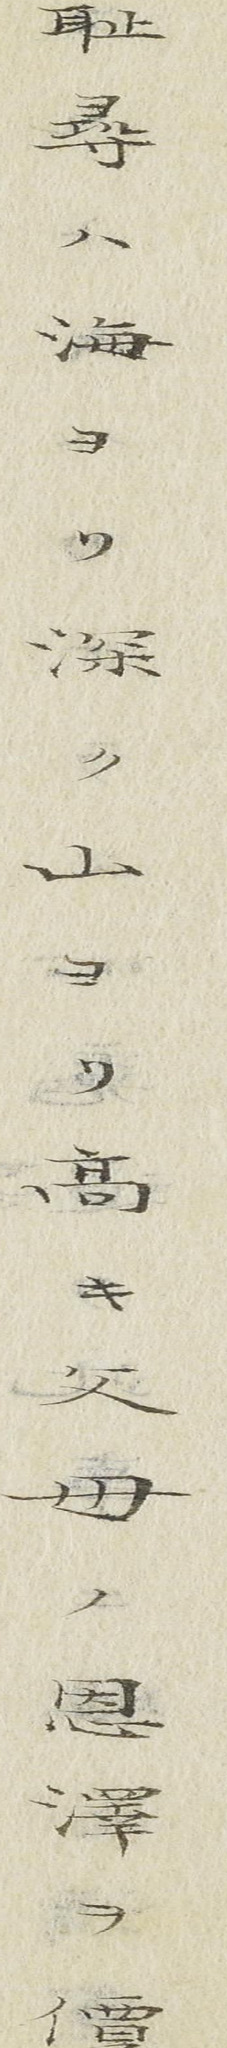恥尋ハ海ヨリ深ク山ヨリ高キ父母ノ恩沢ヲ価
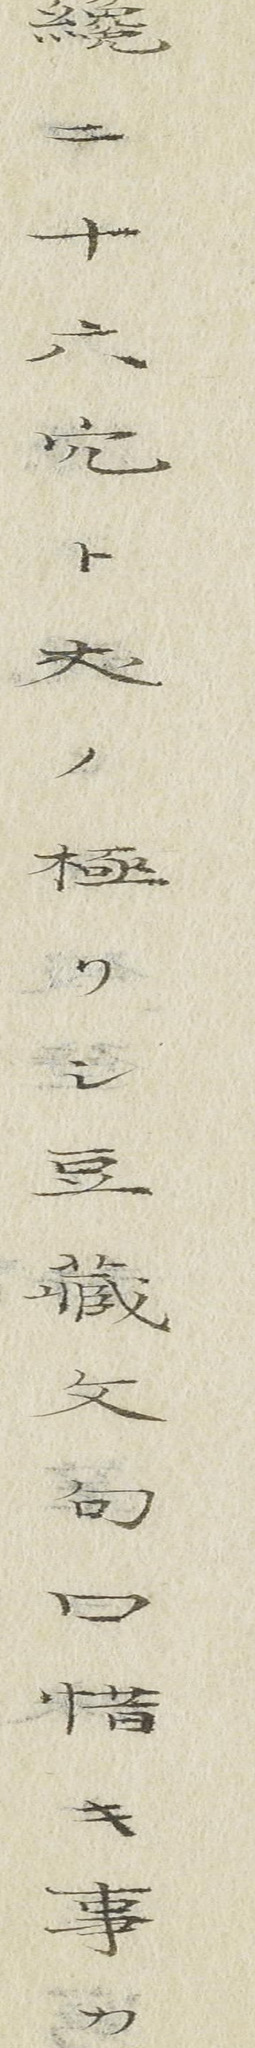纔ニ十六穴ト夫ノ極リシ豆蔵文句口惜キ事カ
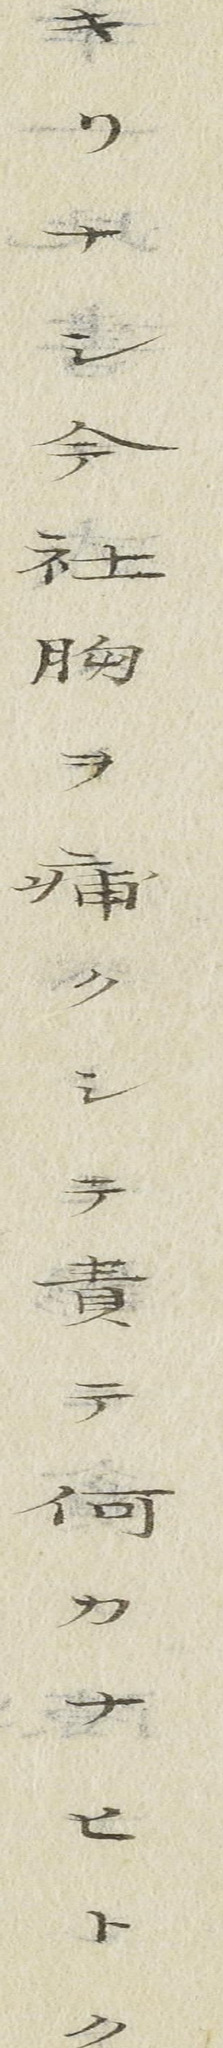キリナシ今社胸ヲ痛クシテ責テ何カナヒトク
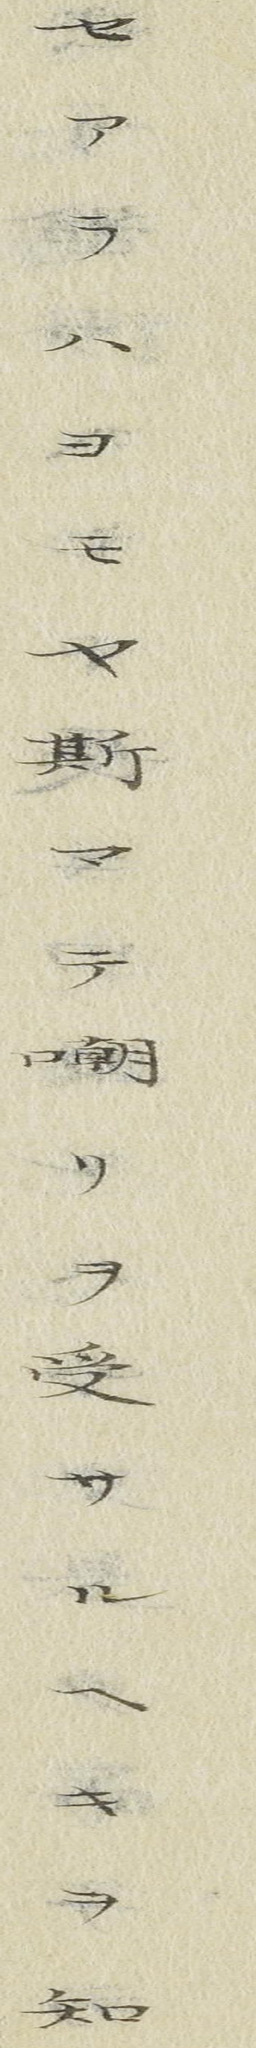セアラハヨモヤ斯マテ嘲リヲ受サルヘキヲ知
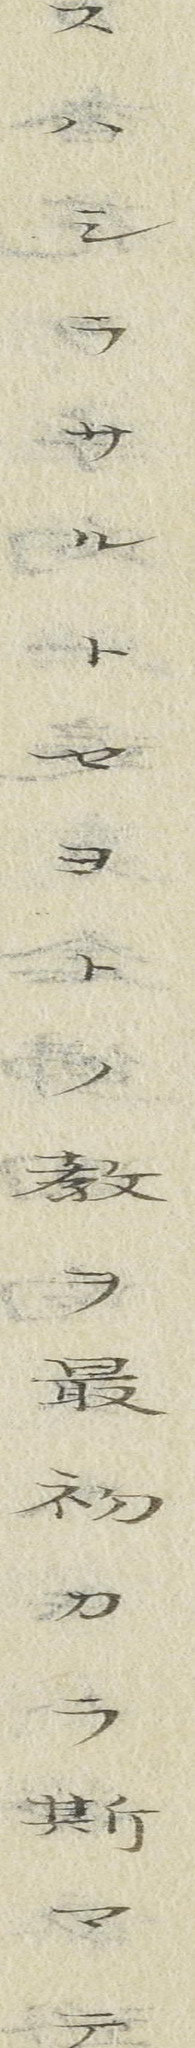スハシラサルトセヨトノ教ヲ最初カラ斯マテ
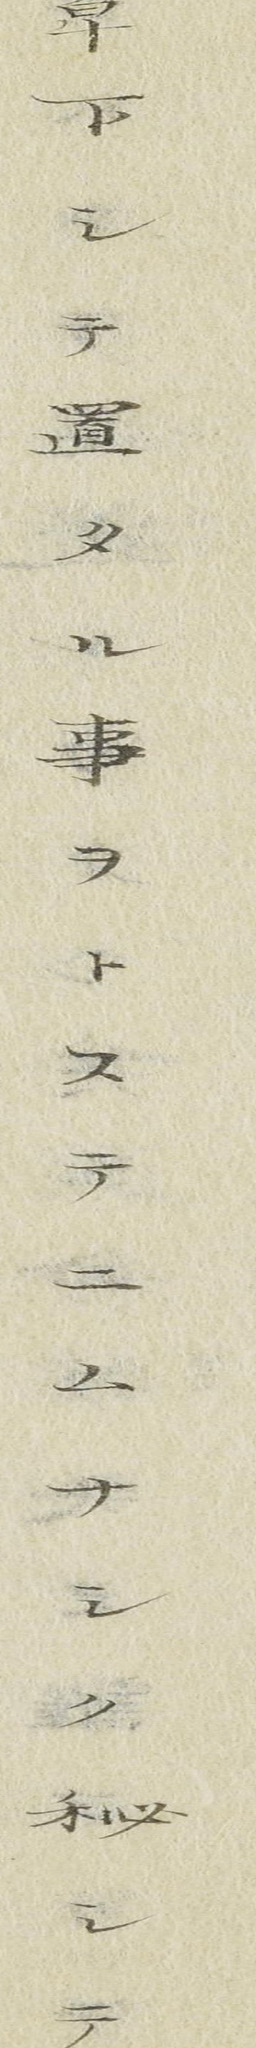卑下シテ置タル事ヲトステニムナシク秘シテ
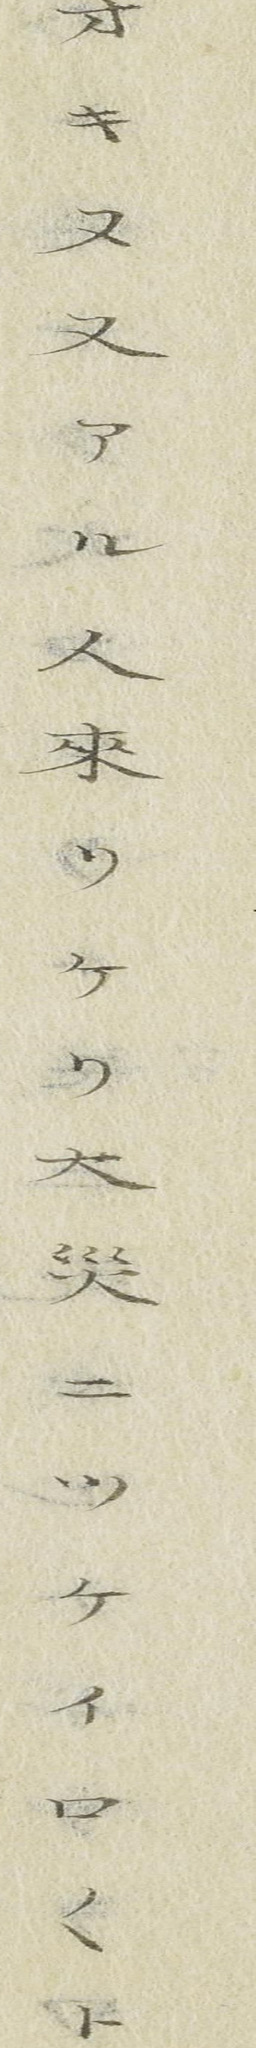オキヌ又アル人来リケリ大災ニツケイロ〱ト
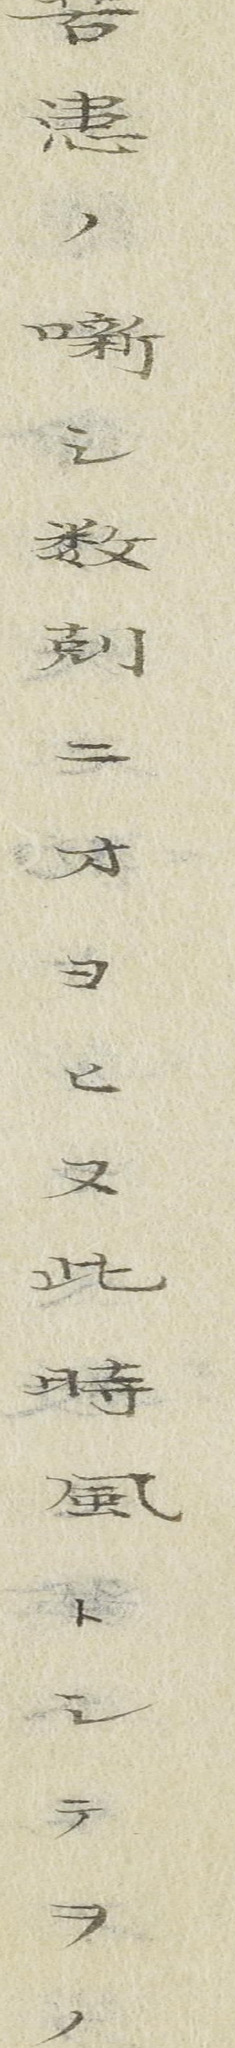苦患ノ噺シ数刻ニオヨヒヌ此時風トシテヲノ
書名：地災撮要　地震之部　巻ノ二
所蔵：東京大学地震研究所図書室 Earthquake Research Institute Library, The University of Tokyo, JAPAN
